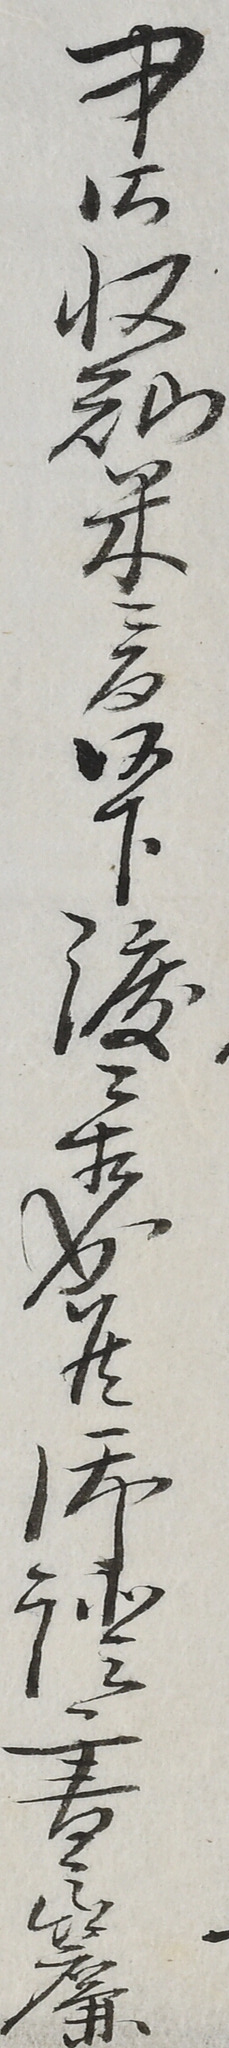申御収納米ニ而以下渡被相成候御証書之簾
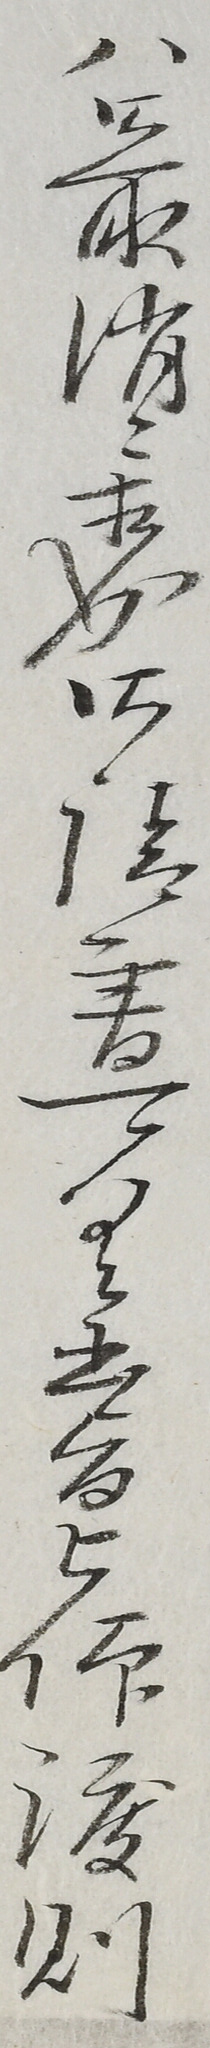ハ御取消ニ相成御請書可具出間被仰渡則
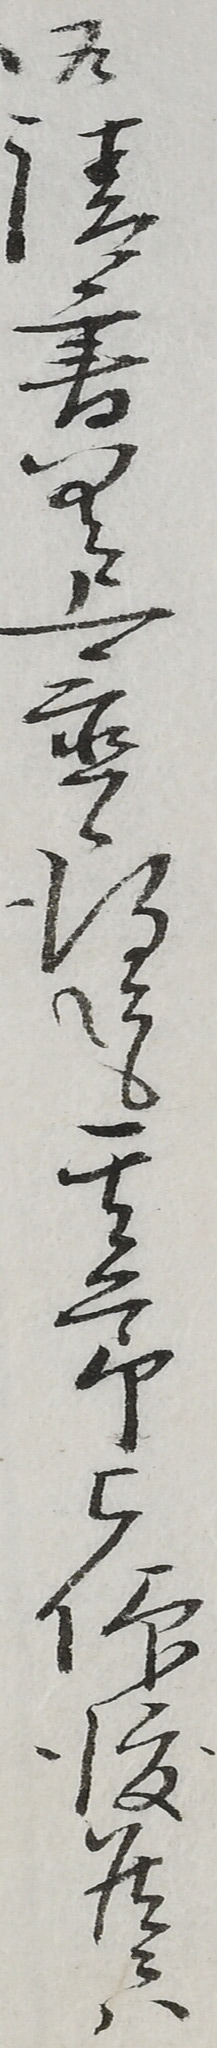御請書具上置候得とも其節被仰渡候ニハ
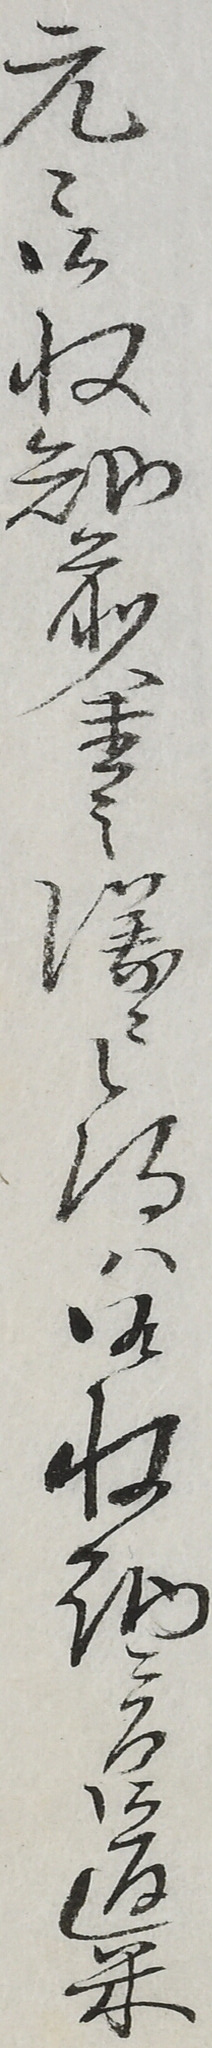元々御収納前金之儀ニ候得ハ御収納ニ而御返米
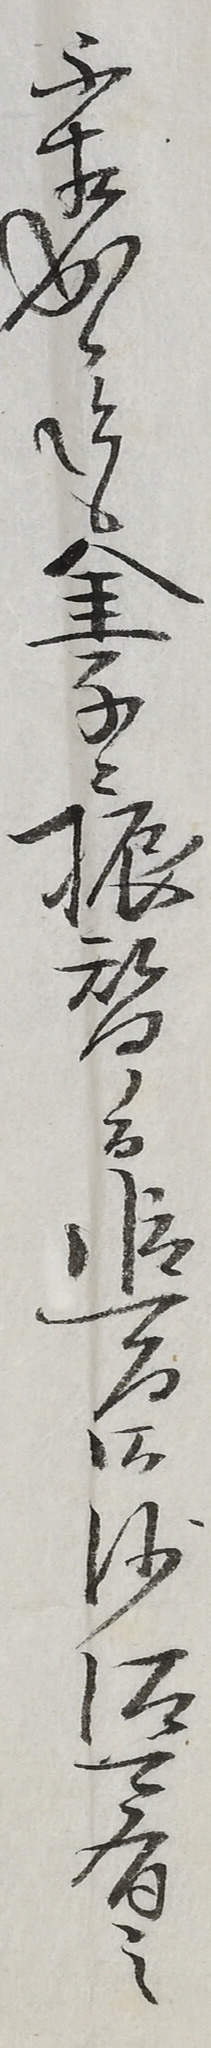不相成候トモ金子と振替ノ而候可為御沙汰可有之
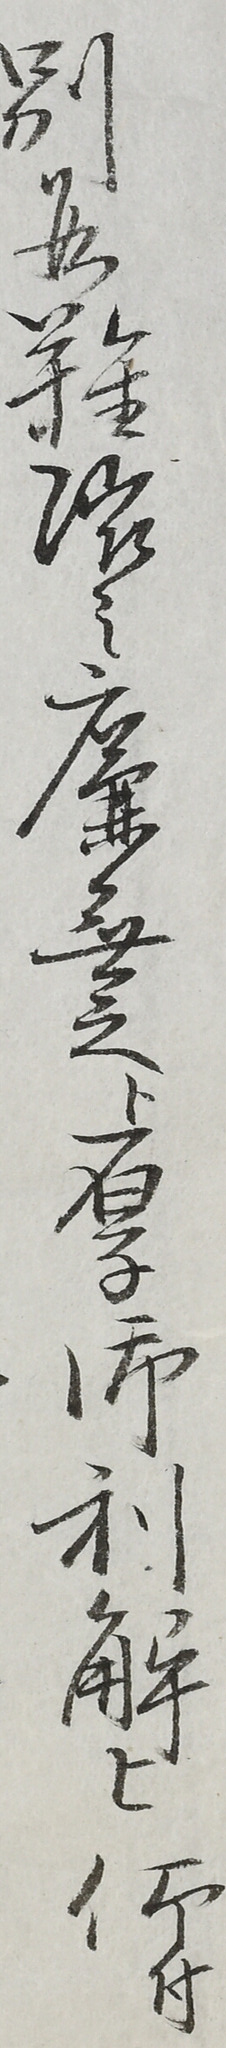別候難渋之廉無之ト厚利解被仰付
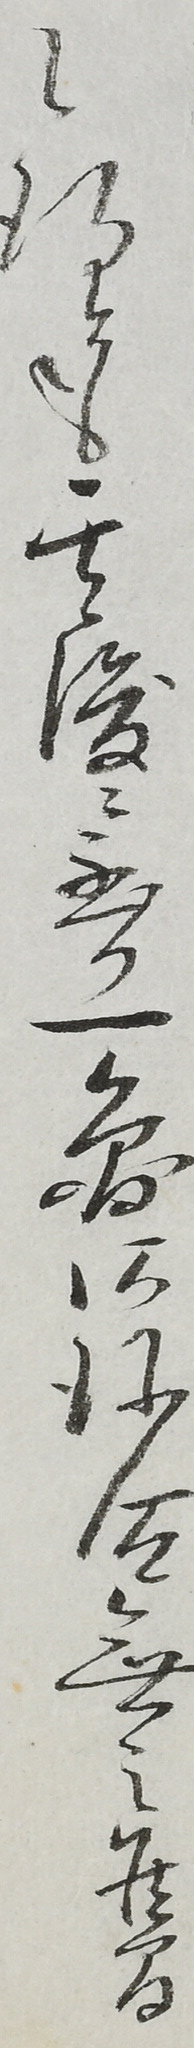候得とも其後ニ至リ一円御沙汰無之候間
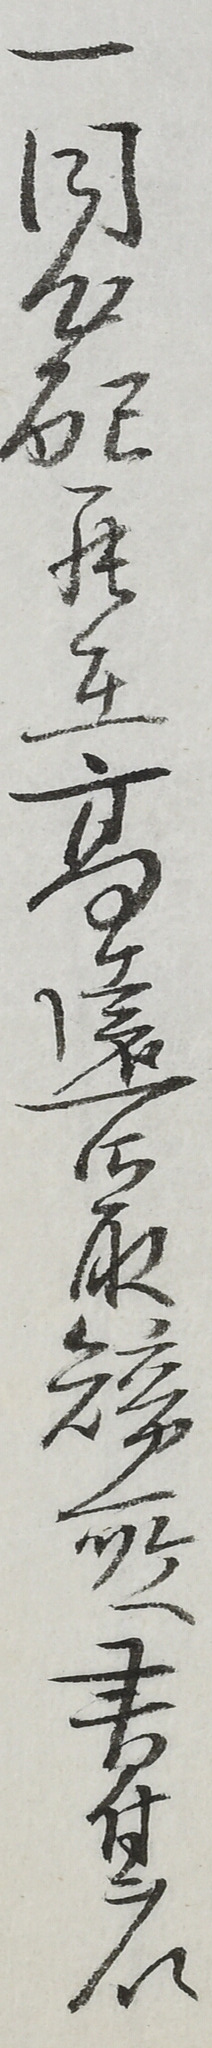一同心配罷有高遠御取締所ヘ書付ヲ以
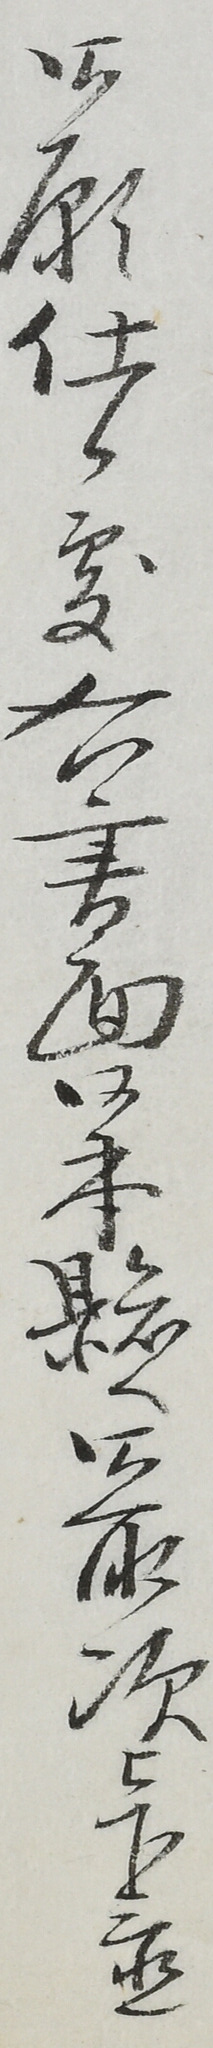御願仕候処右書面御本県ヘ御取次被下置
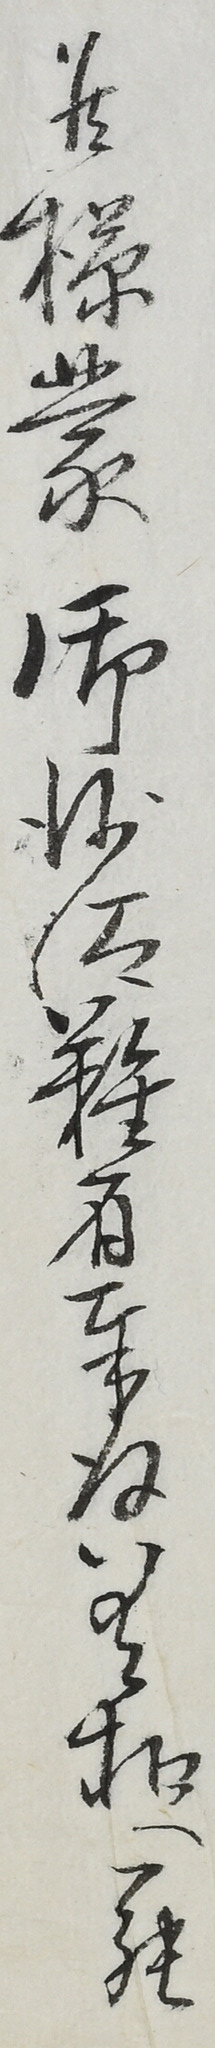候様蒙御沙汰難有奉行差扣ヘ罷

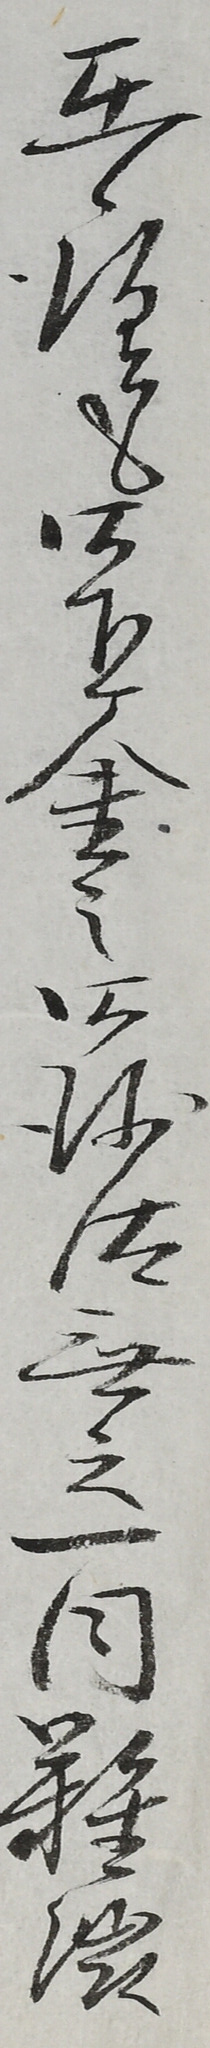在候得とも御下金之御沙汰無之一同難渋
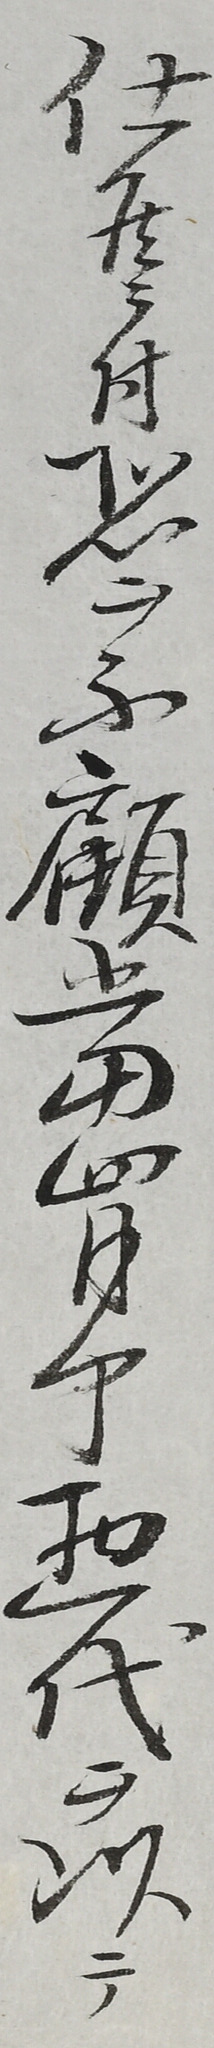仕候ニ付恐ヲ不顧当正月中惣代ヲ以テ
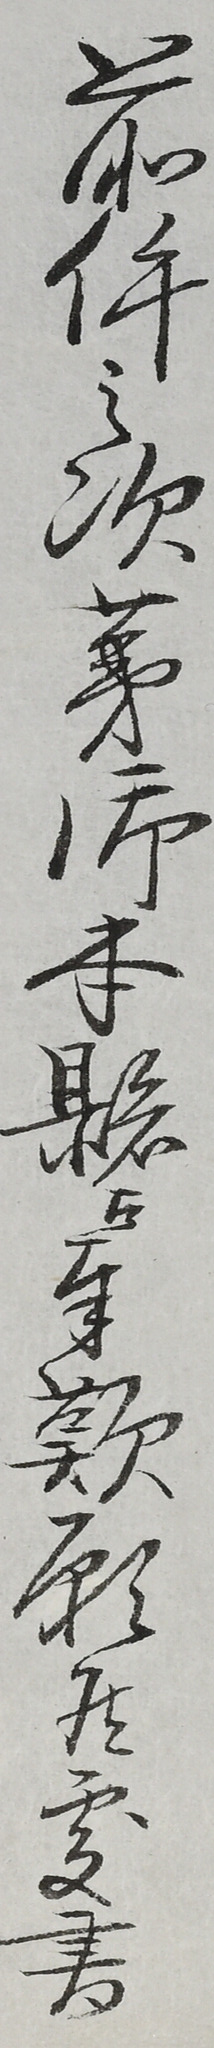前件之次第御本県江奉歎願候処書
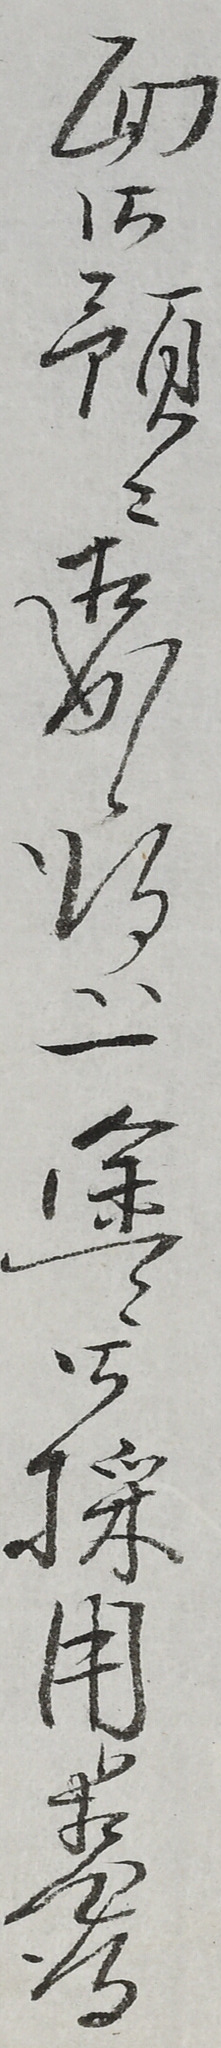面御預ニ相成候得ハ一途ニ御採用御合心得
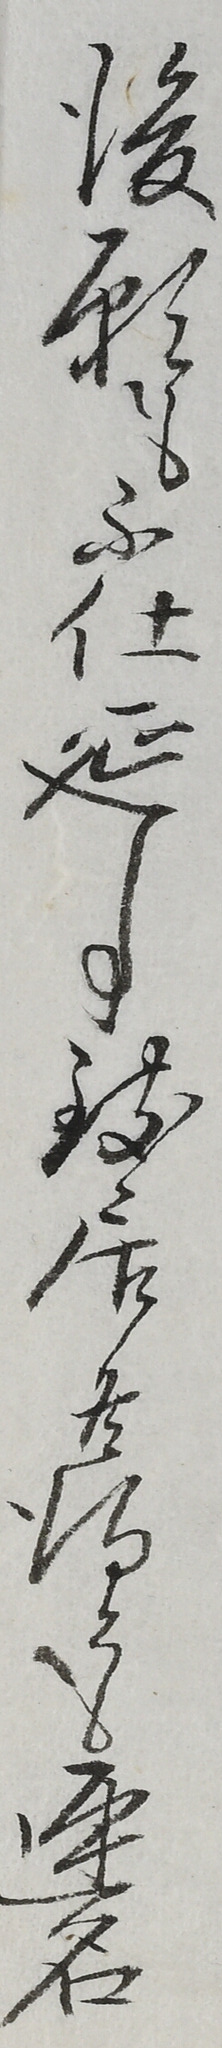後願も不仕延事致居候得とも連名
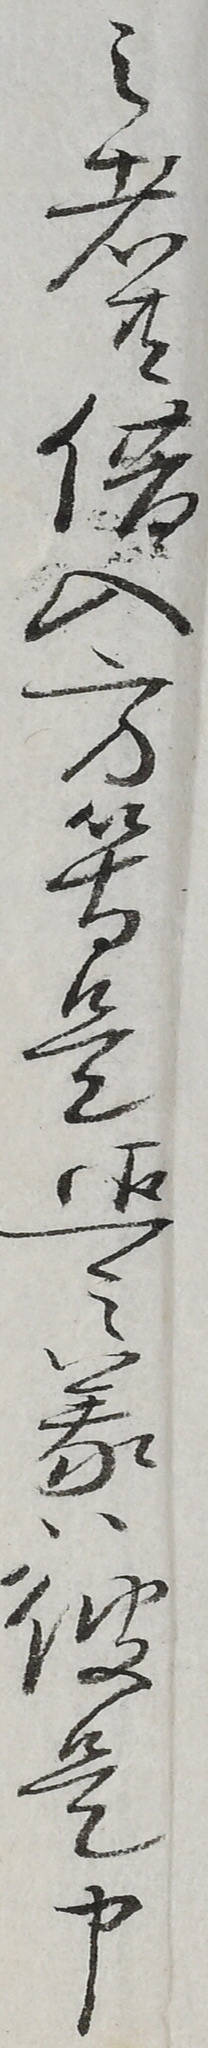之者共借入方等是返之義ハ彼是申
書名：乍恐以書付奉願上候
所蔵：伊那市立高遠町図書館・合同会社AMANE
